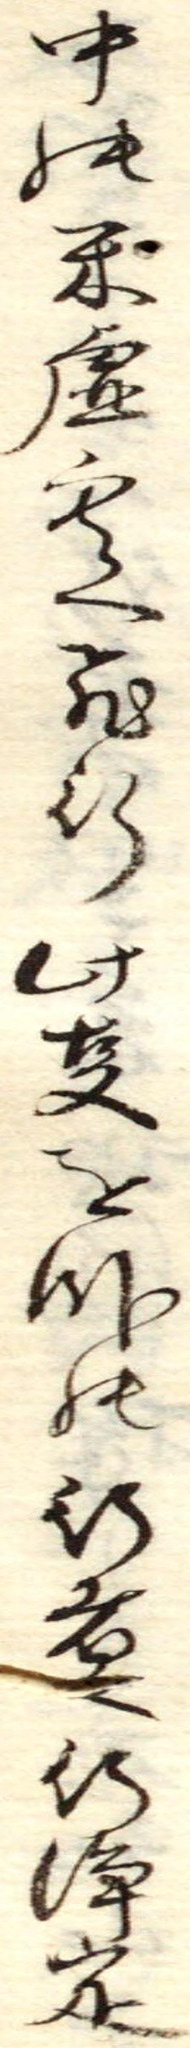中の米虚空へ飛行此事を臥の行者へ行浄定

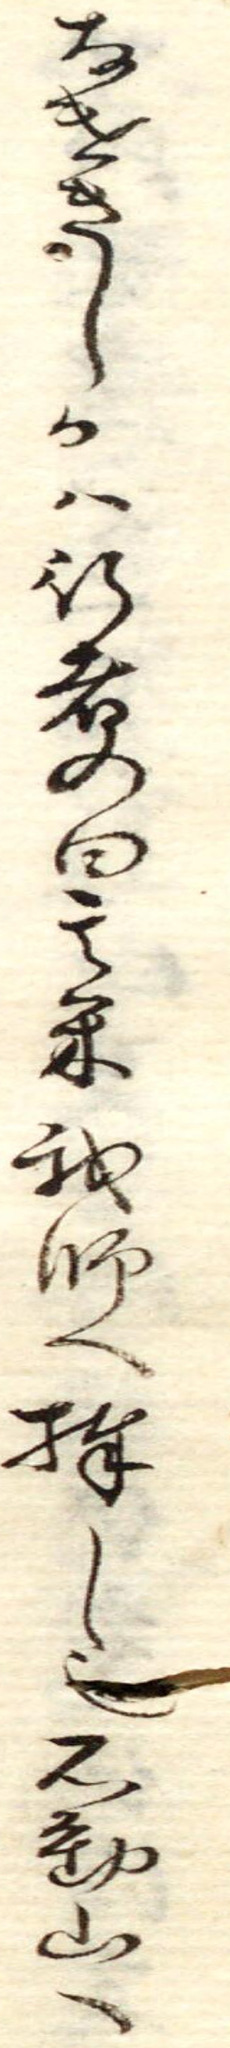なけきしかは行者の曰其米を我師へ捧し也石動山へ
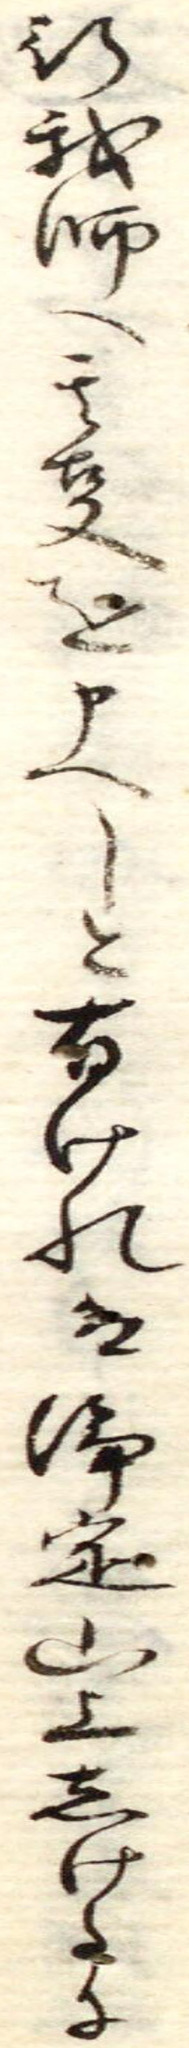行我市師へ其事を申へしと有けれは浄定山上しけるに
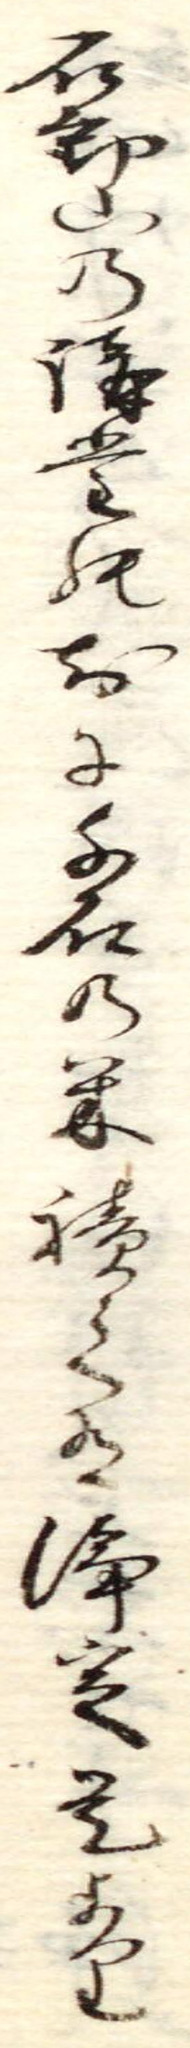石動山の講堂の前に千石の米積て有浄定是より
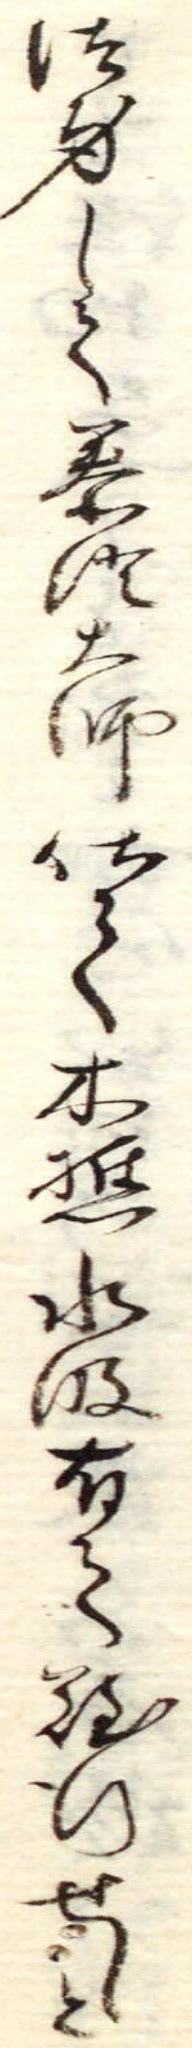法身して泰澄大師仕て木樵水汲有て難行せしと
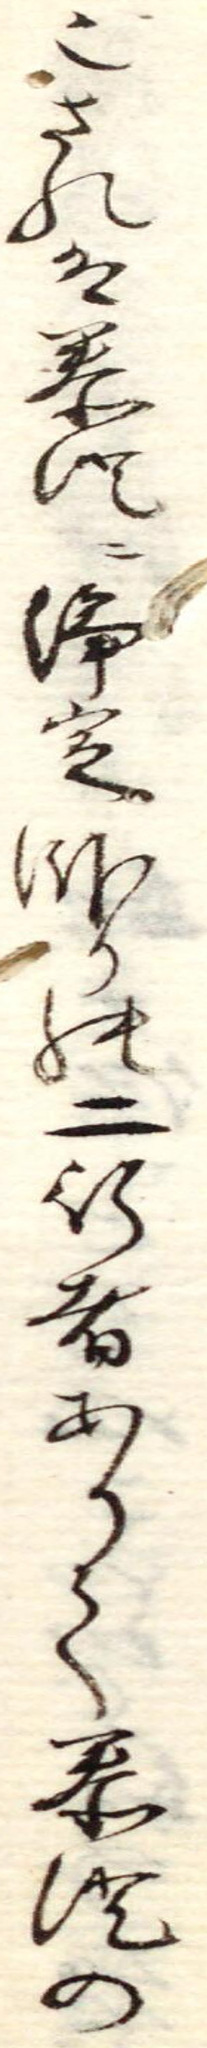也されは泰澄に浄定臥りの二行者ありて泰澄の
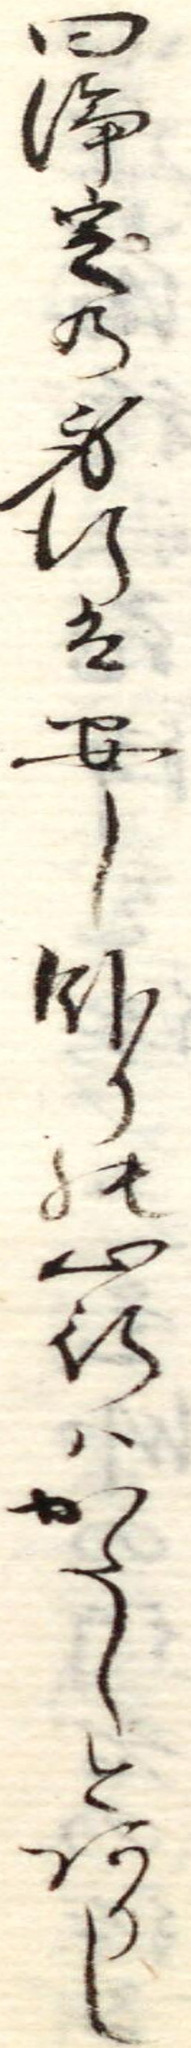曰浄定の身行は安し臥りの心行はかたしとありし
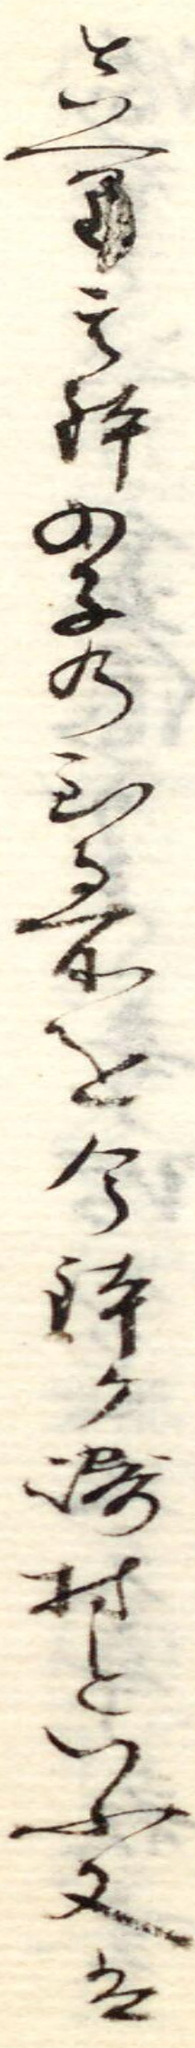といへり其鉢の子の至る所を今鉢ヶ崎村といふ又は
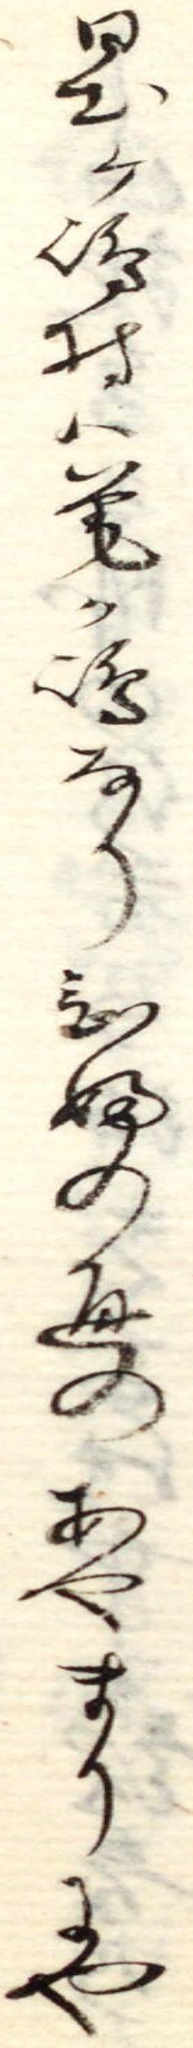日出ヶ嶋村は筆か嶋なりひふの通のあやまりにや
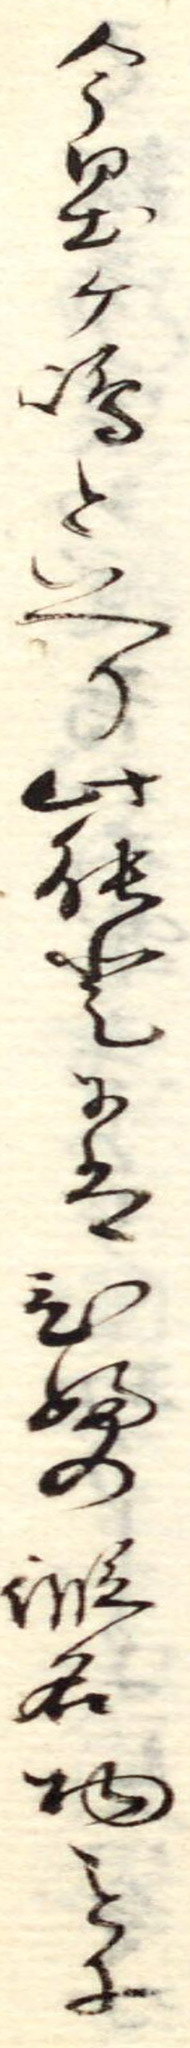今日出ヶ嶋といへり此能登にはひふの仮名物ことに
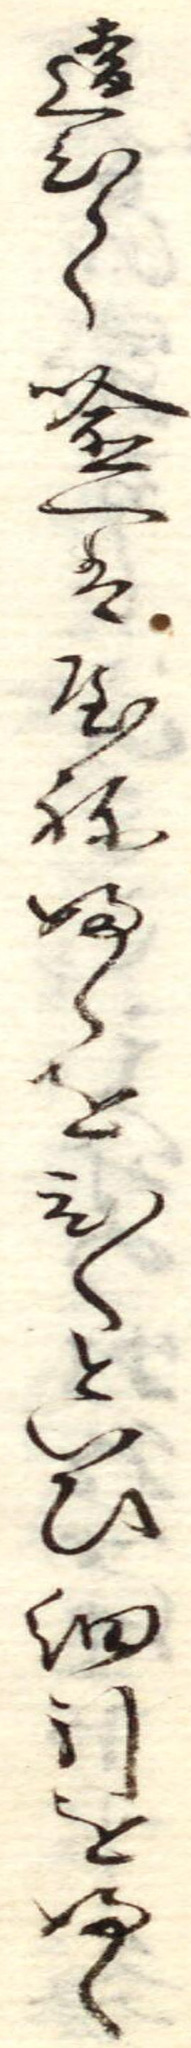違ひて喩一はやねふくをひくといひ細引をふく
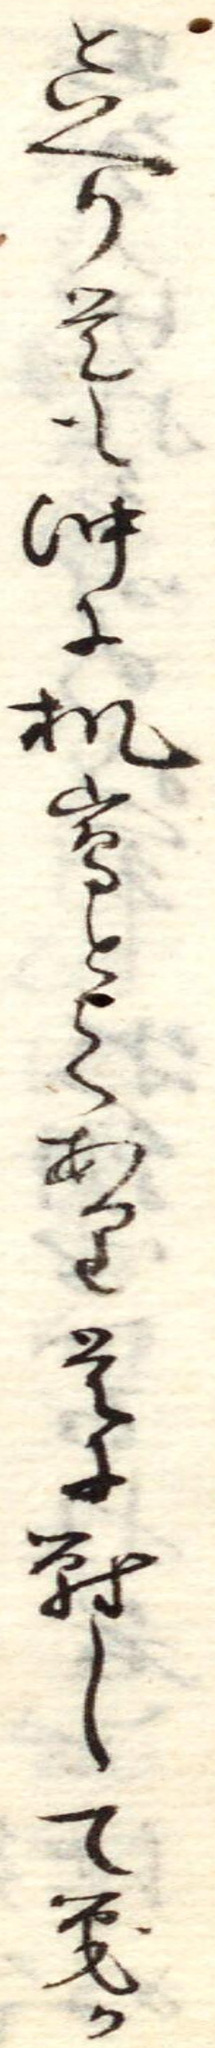といへり是も沖に机嶌とてあり是に対して筆か
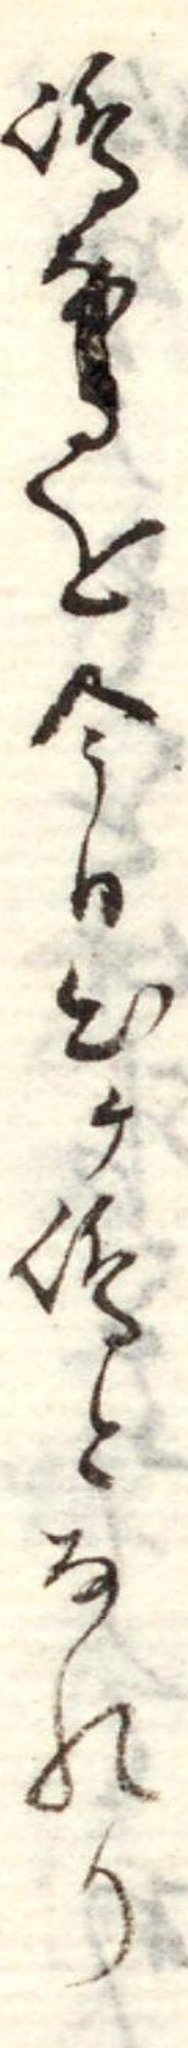嶋を今日出ヶ嶋となれり
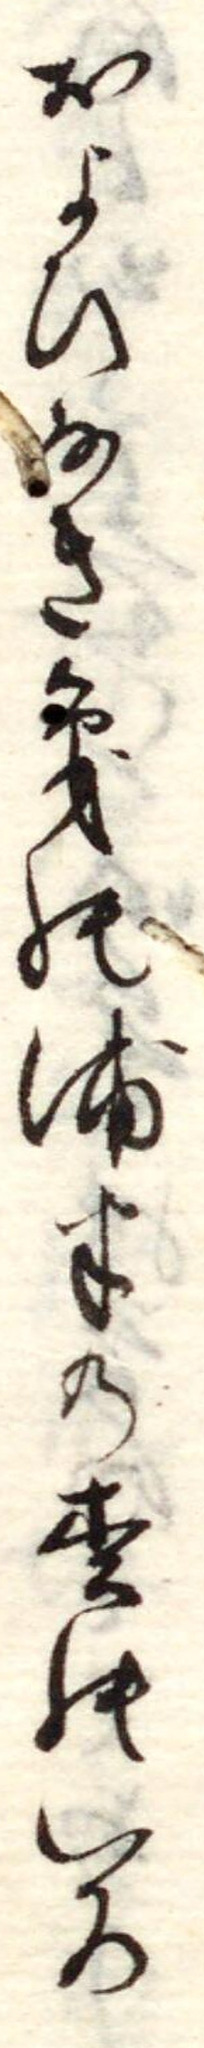およひなき筆の浦半の枩のいろ
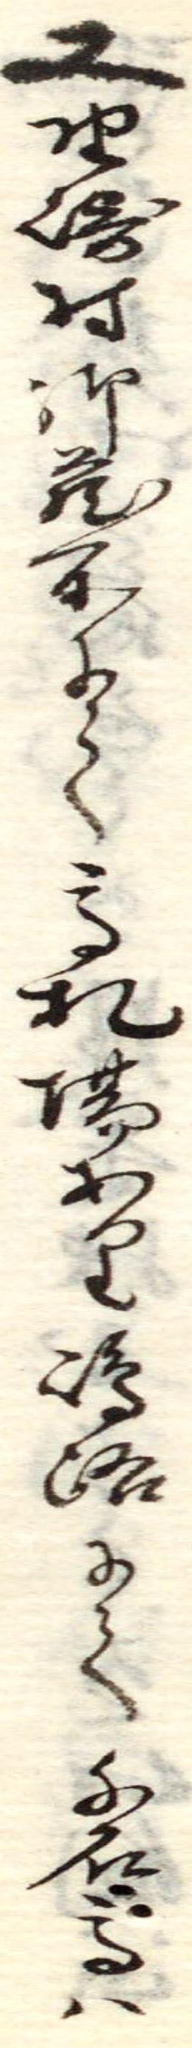又野崎村御蔵所にて高札場あり嶋路にて千石高は
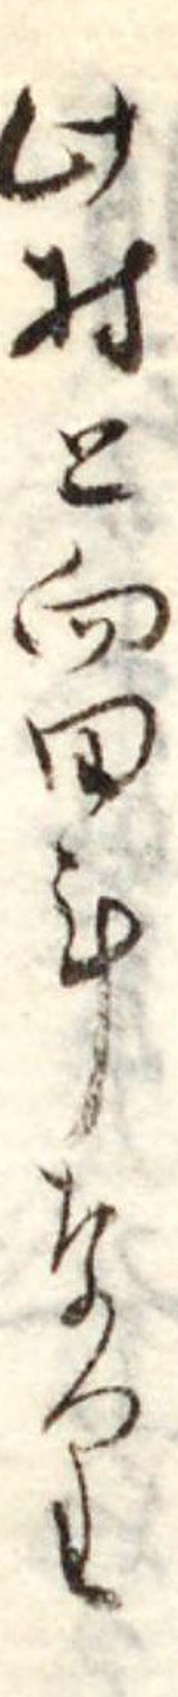此村と向田計なり
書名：能登名跡誌
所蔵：Ishikawa Prefectural Library
